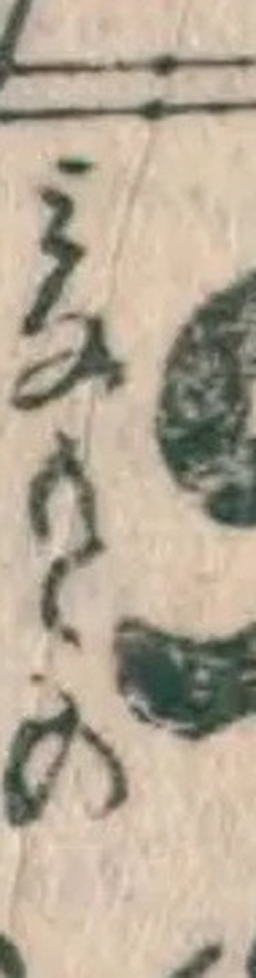みなもとの
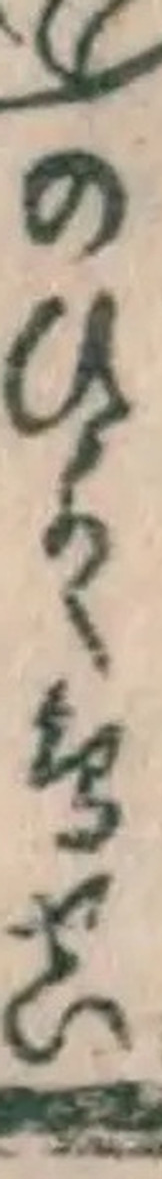のひよく鳥せい
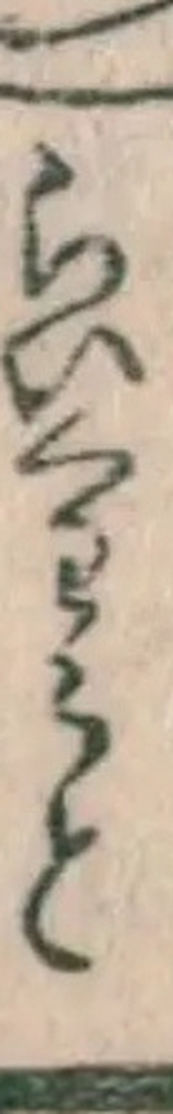らいくわうと
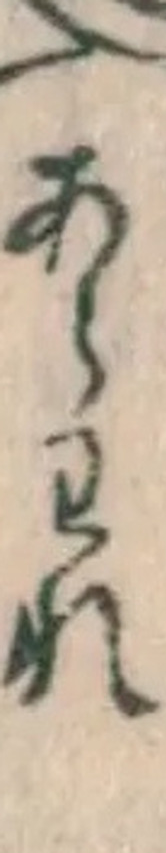あらわれ
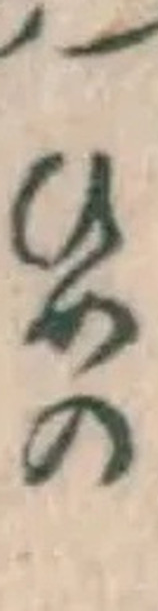ひめの
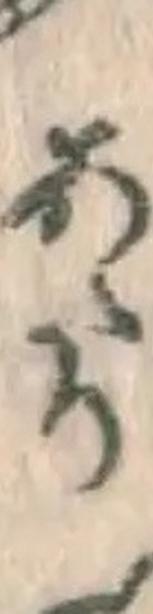あたり
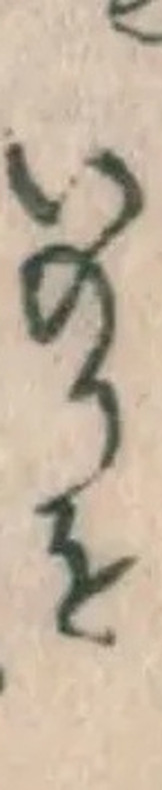いのりを
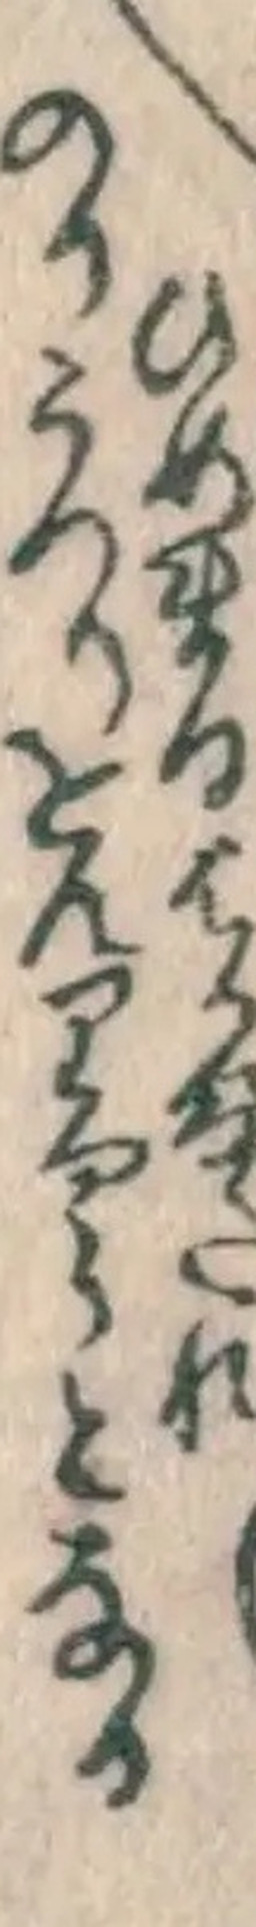のりうつりをんりやうとなる
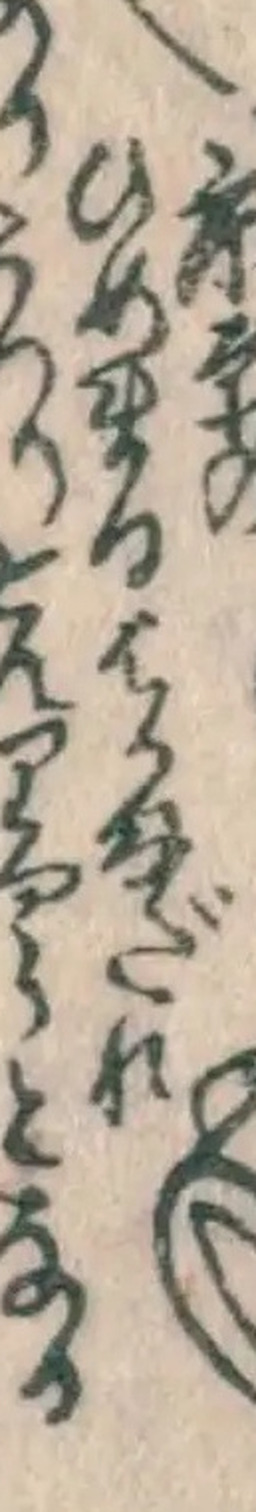ひめまるはかまだれ
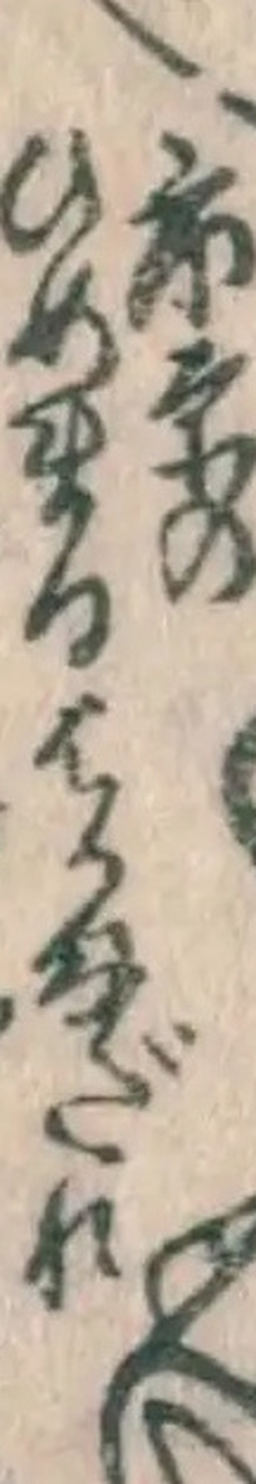ひめまるはかまだれ
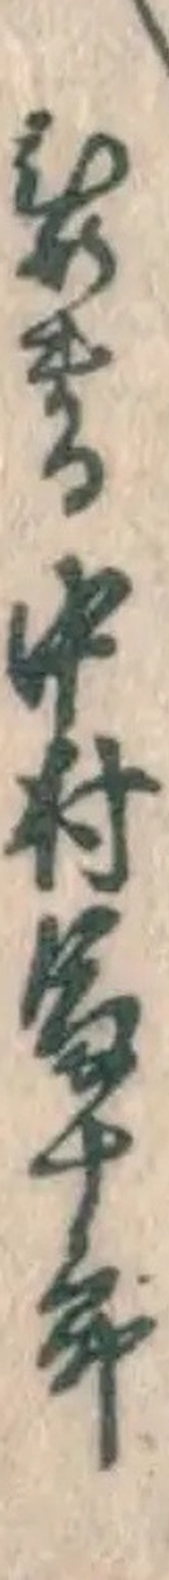ひめまる中村富十郎

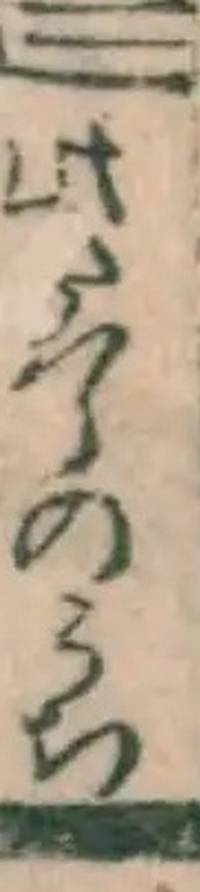此たはらのうち
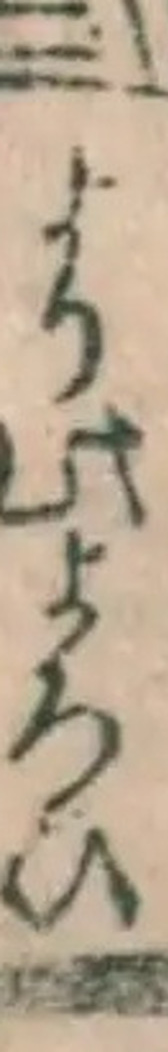より此よろひ
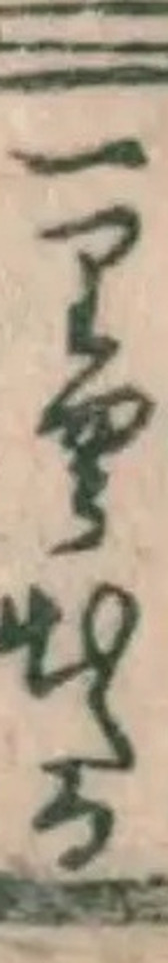一りやう出たる
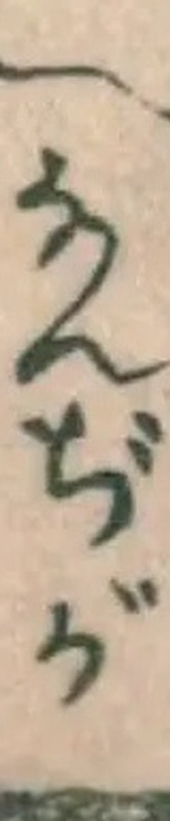なんぢが
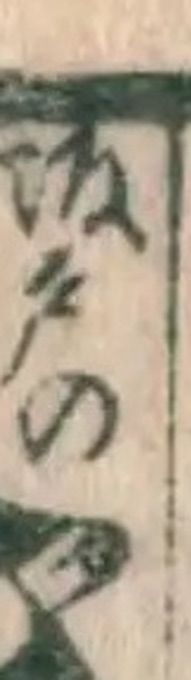坂戸の
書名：菊慈童酒宴岩窟
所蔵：国立国会図書館 National Diet Library, JAPAN
